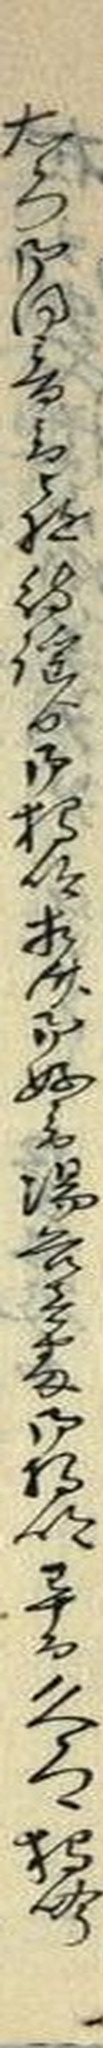右衛門御同音ニ而被遊待謡ゟ御独吟相済御好ニ而湯谷壱番御独吟畢而久右衛門へ独吟
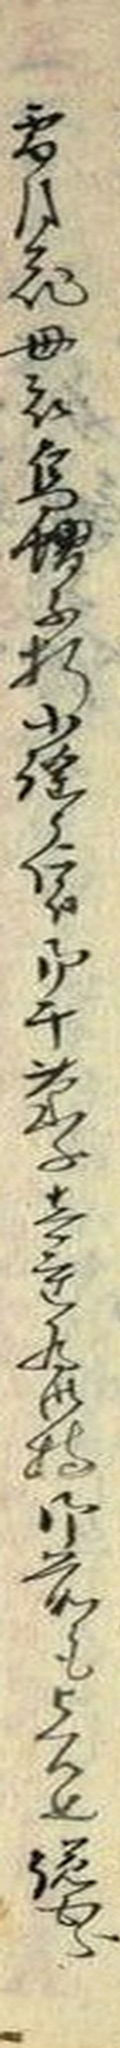雪月花母衣烏帽子折小謡被仰付御干菓子壱重為御持御前ニも被召上謙五郎
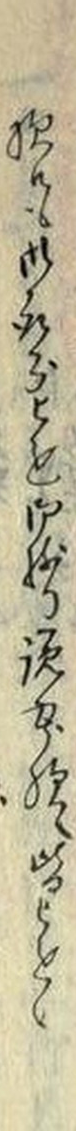様江も御取分被進御残り謙五郎様へ皆被進候
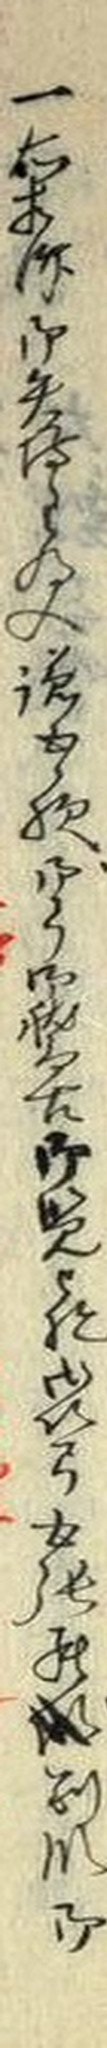一右相済御矢場へ被為入謙五郎様御弓御稽古御覧被遊御次弓五張罷出別段御
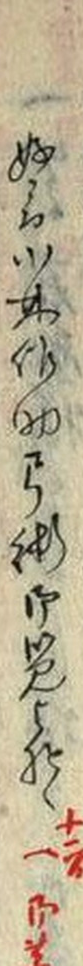好ニ而小林作助弓術御覧被遊候
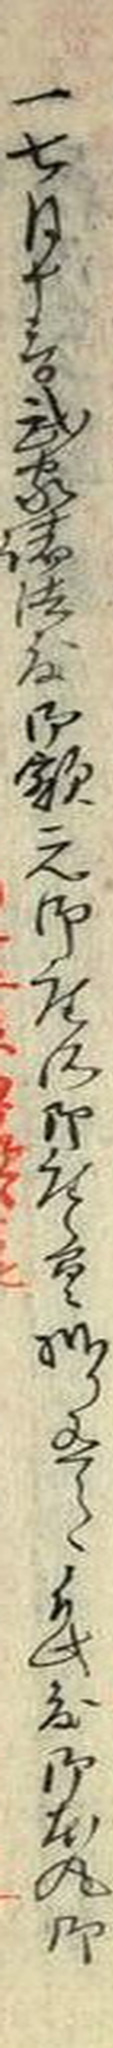一七月十三日武家諸法度御額元御座所御座之間ニ掛り有之候ニ付此度御本丸御
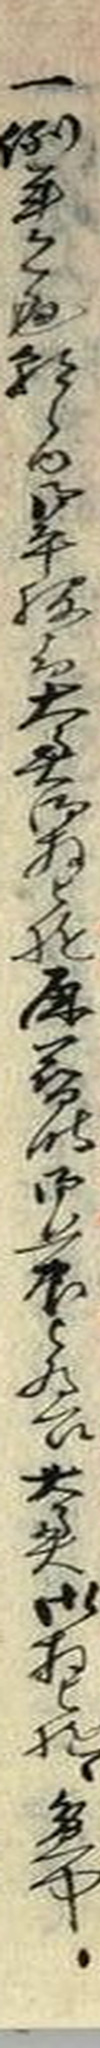一例年之通朝之内御平服ニ而大奥御拝被遊再暮時御上下被為召大奥御拝被遊候盆中
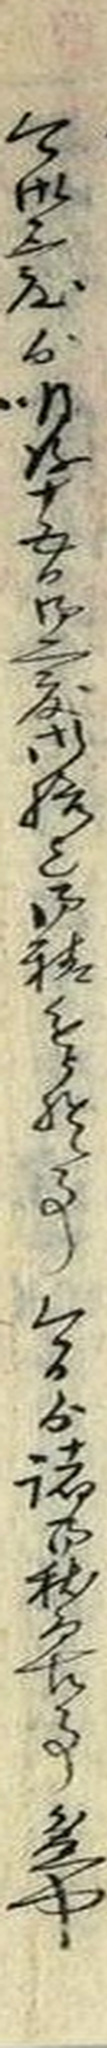今御三度ゟ明後十五日御二度御膳迄御精進被遊候事今日ゟ諸御稽古事盆中
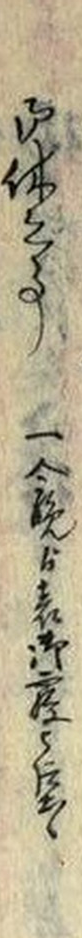御休之事一今晩ゟ表御寝被仰出候

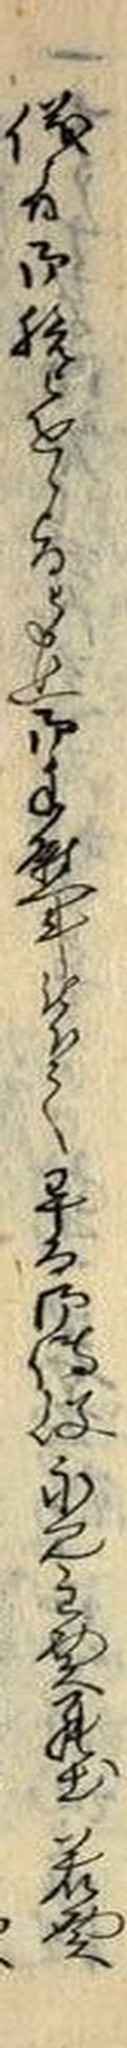儀ニ付御膳被進候旨被申上御手慰斗被下之畢而御傅役永見主殿罷出若殿
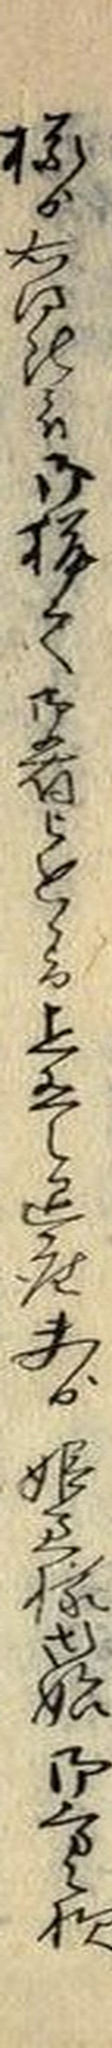様ゟ右同断ニ付御猟之御肴被進候旨申上有之退座夫ゟ姫君様御始御方々様
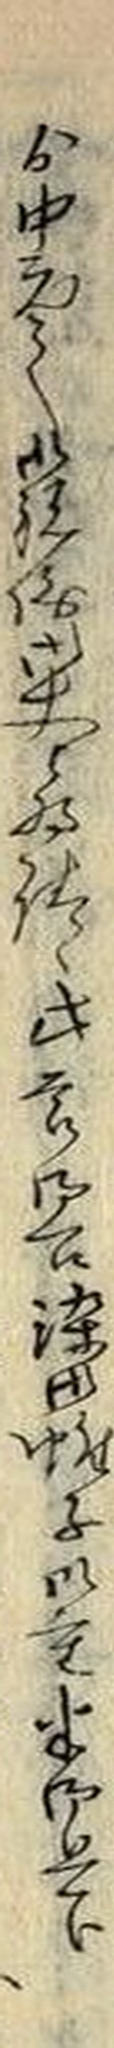ゟ中元之御祝儀御使被為請候此節御召染御帷子御重半御上下
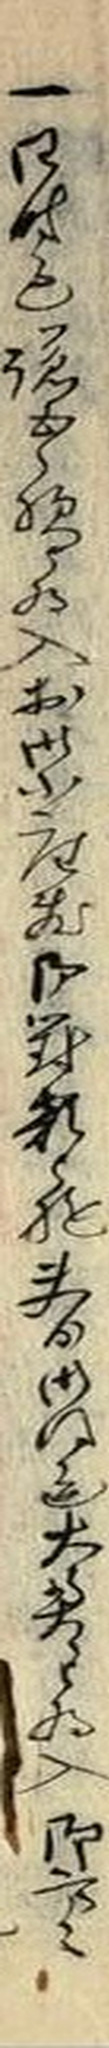一四時過謙五郎様被為入於御小座敷御対顔被遊夫ゟ御同道大奥へ被為入御方々
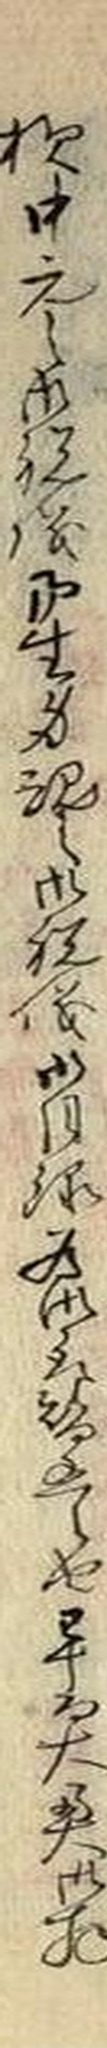様中元之御祝儀御生身魂之御祝儀御目録為御取替有之由畢而大奥御拝
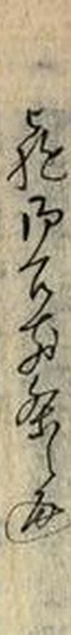被遊御召前条之通
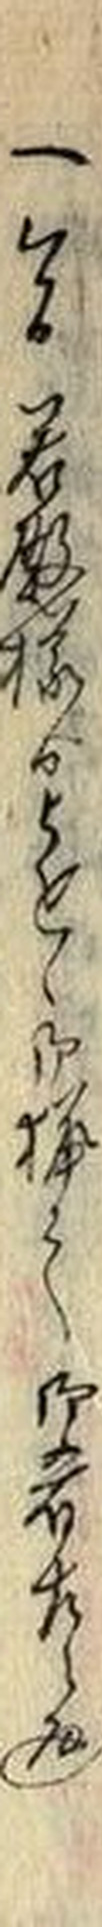一今日若殿様ゟ被進候御猟之御肴左之通
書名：少傅日録抄（斉承付側向頭取日記、在国）
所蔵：福井県文書館 Fukui Prefectural Archives
